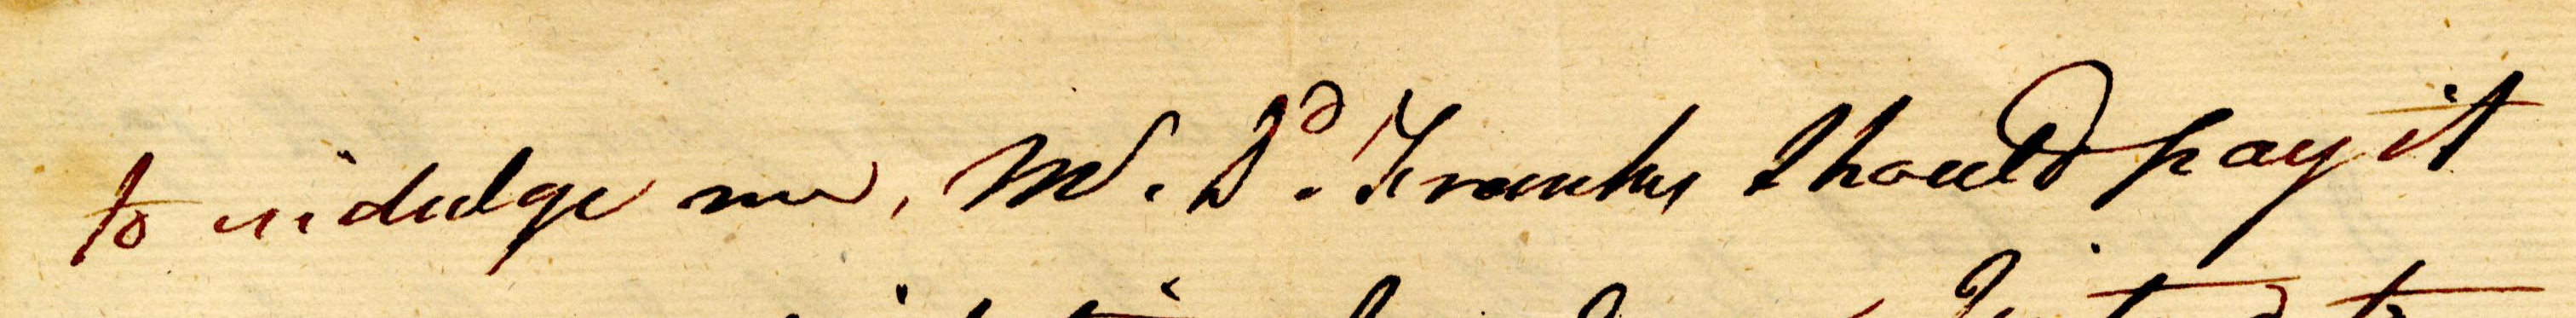to indulge me, M^r. D^d. Franks should pay it
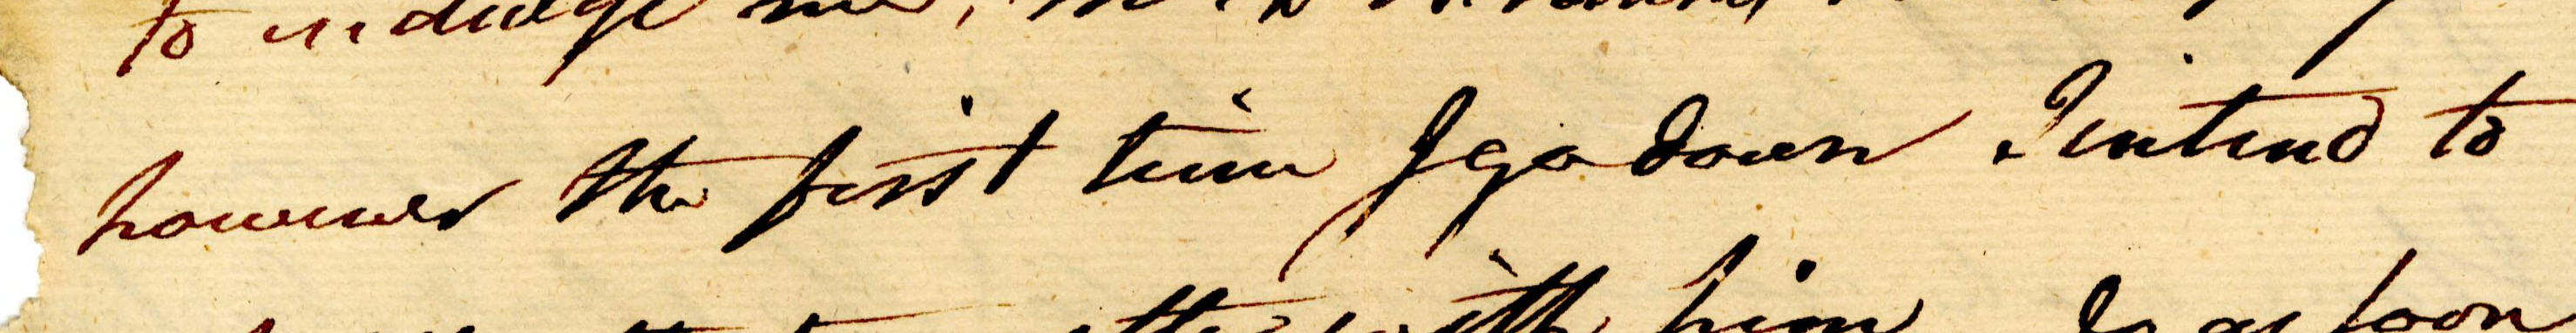however the first time I go down I intend to
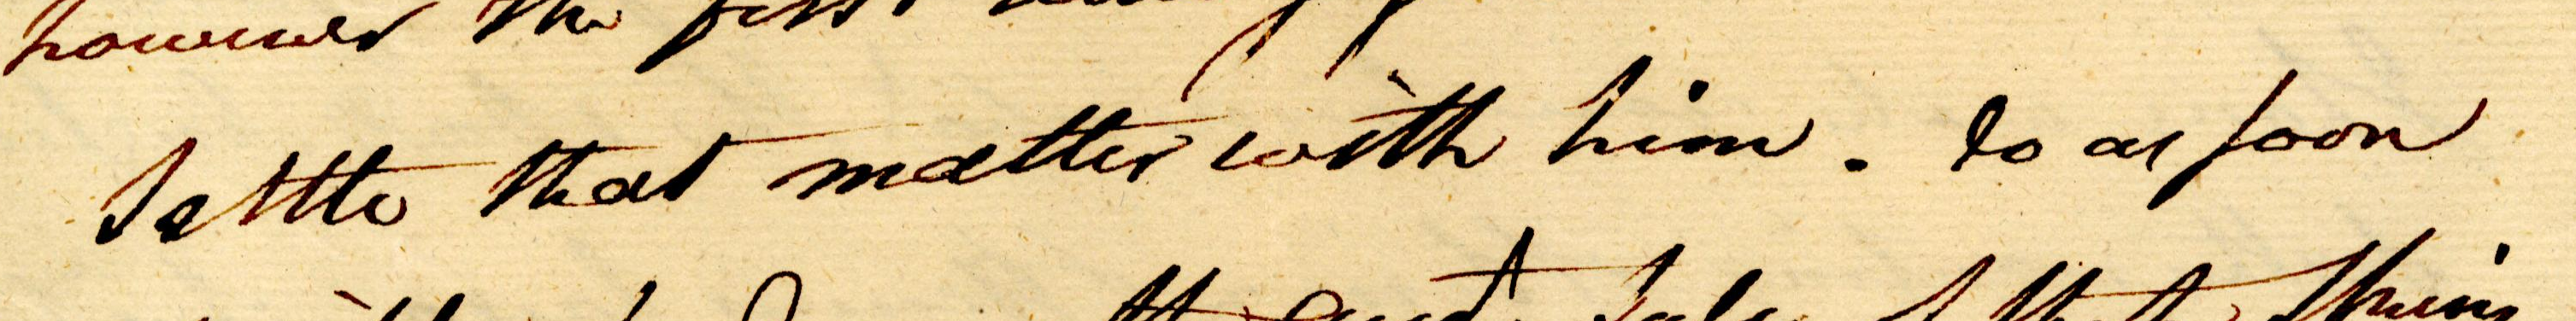Settle that matter with him. So as soon
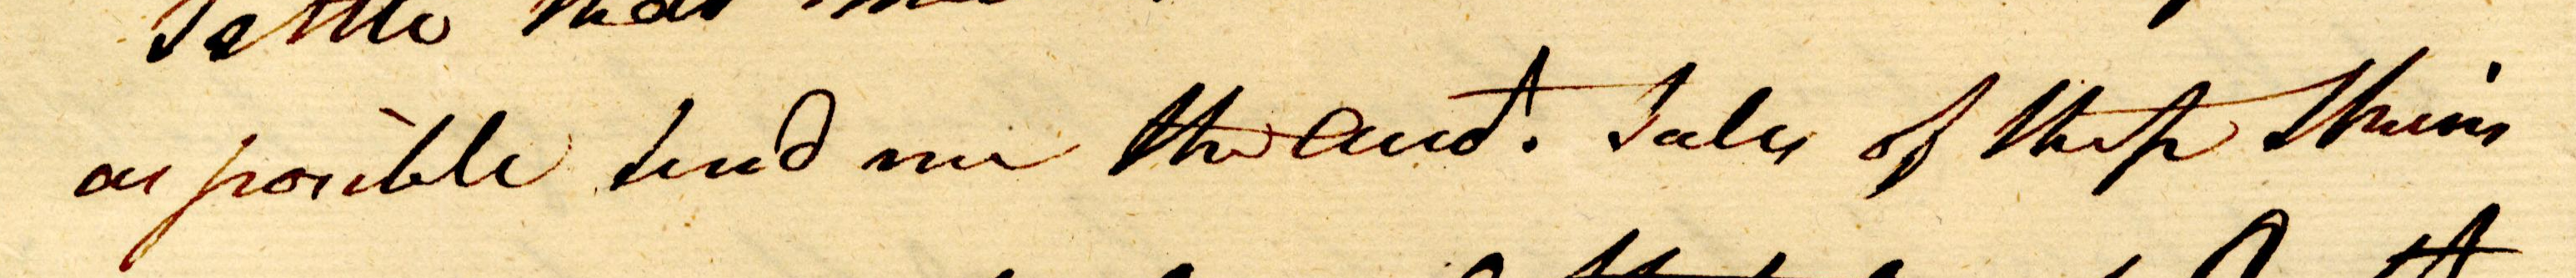as possible send me the Acco^t. Sales of these skins
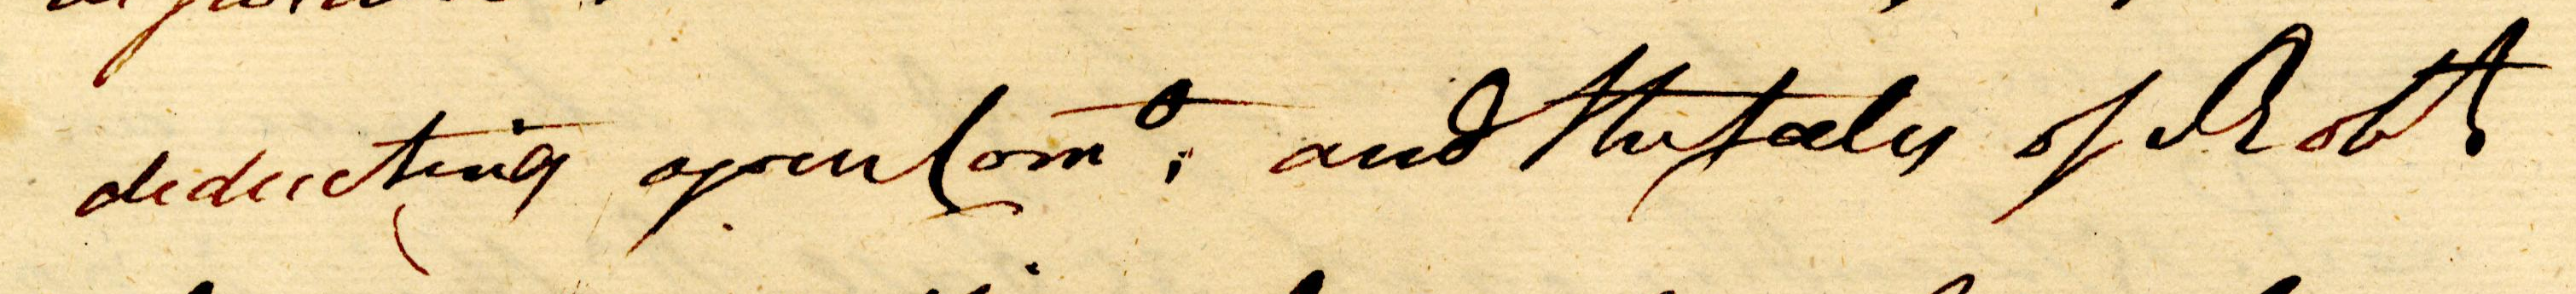deducting you Com^o, and the sales of Rob^t.
